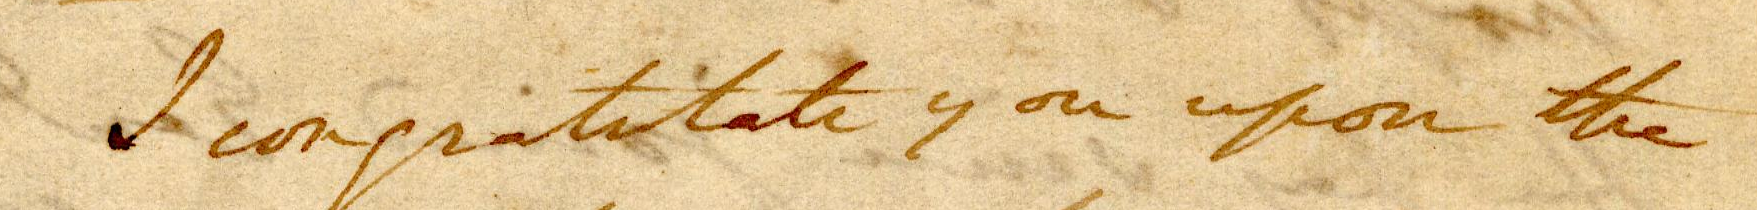I congratulate you upon the
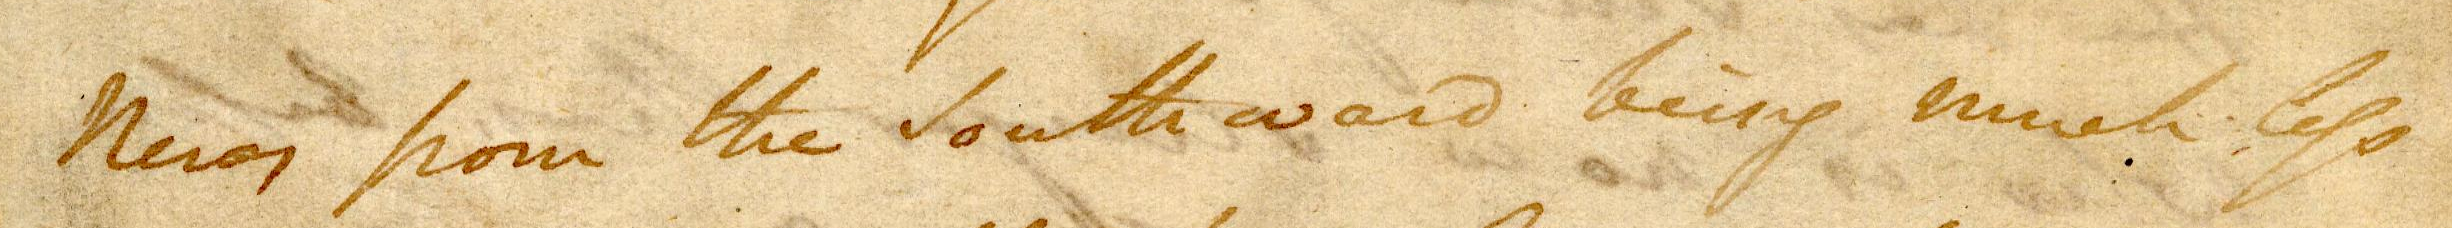News from the Southward being much less
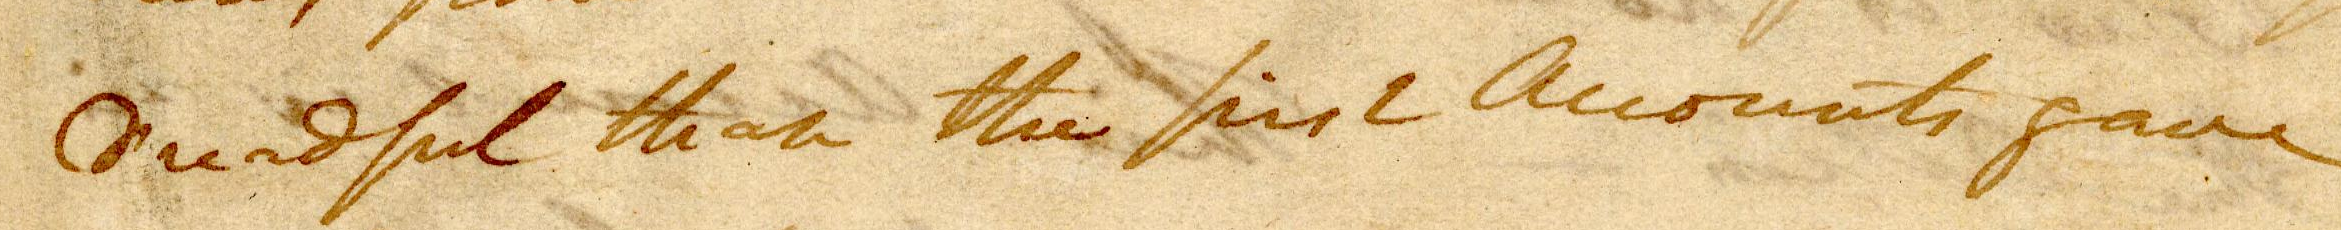dreadful than the first Accounts gave
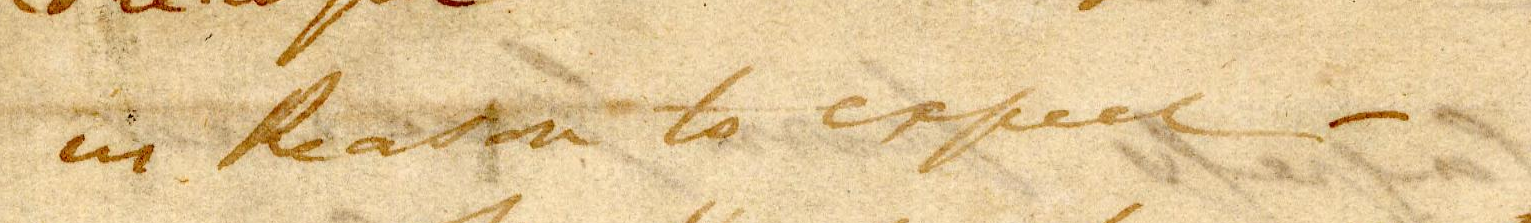in Reason to expect.
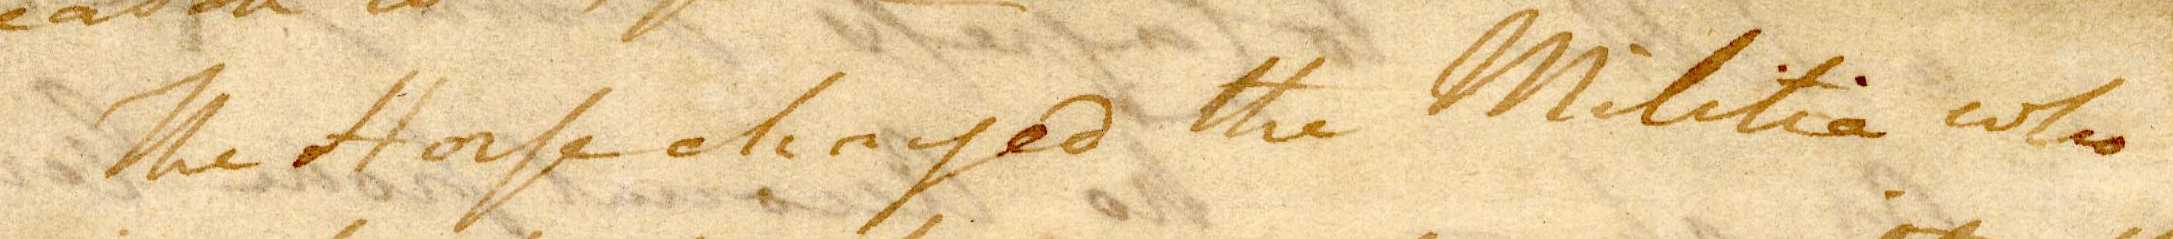The Horse charged the Militia who
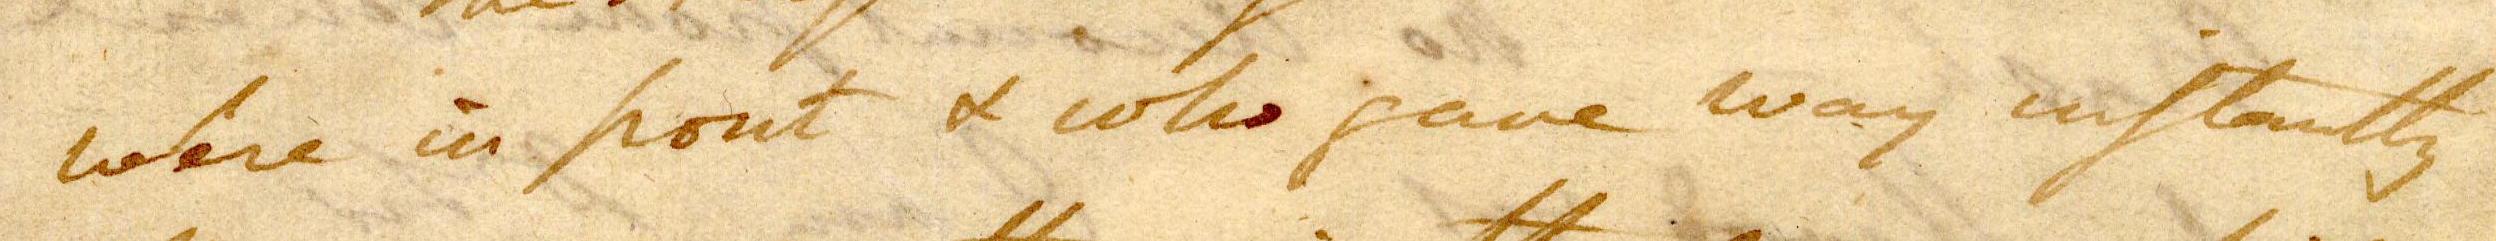were in pout & who gave way instantly
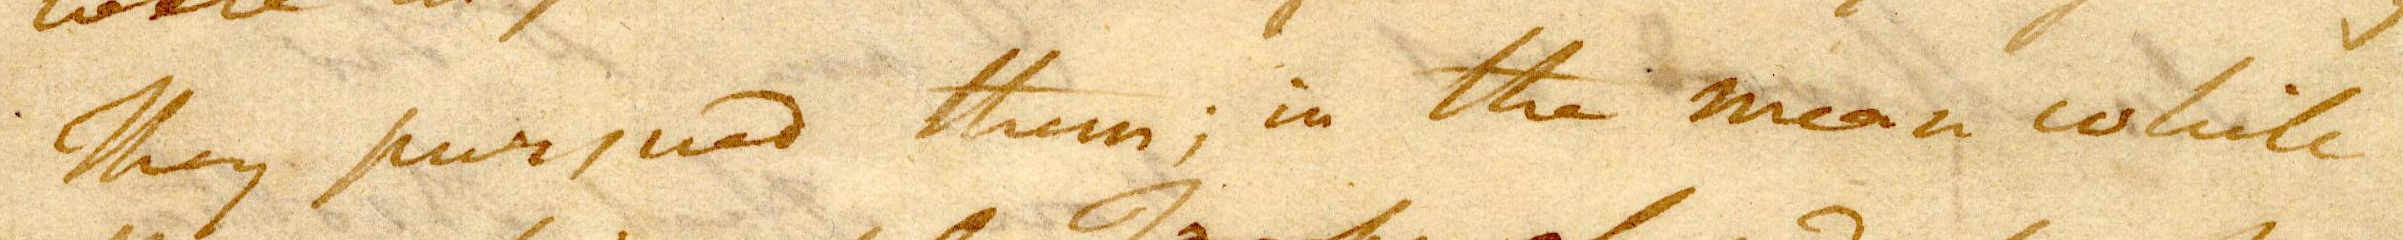They pursued them; in the mean while
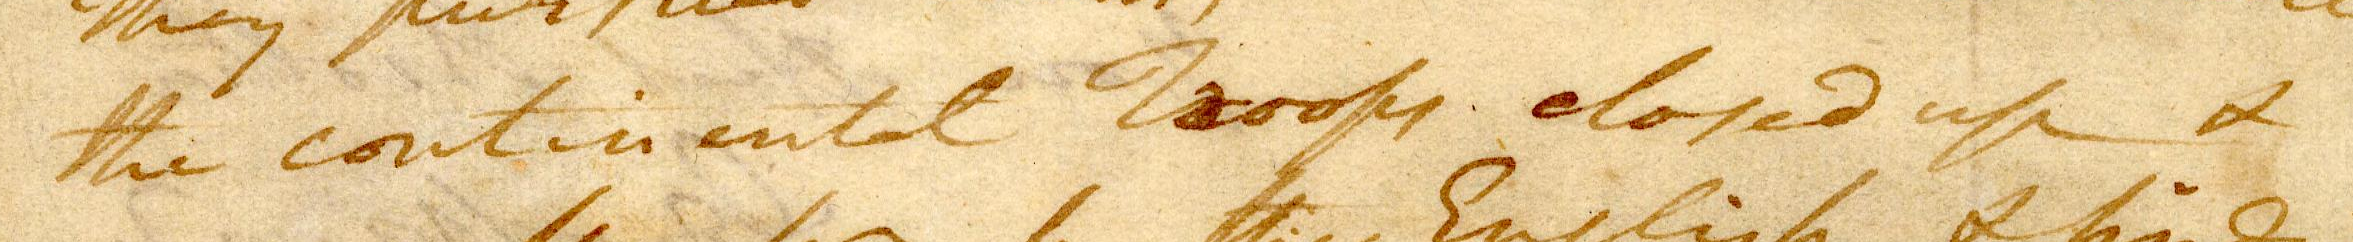the continental Troops closed up &
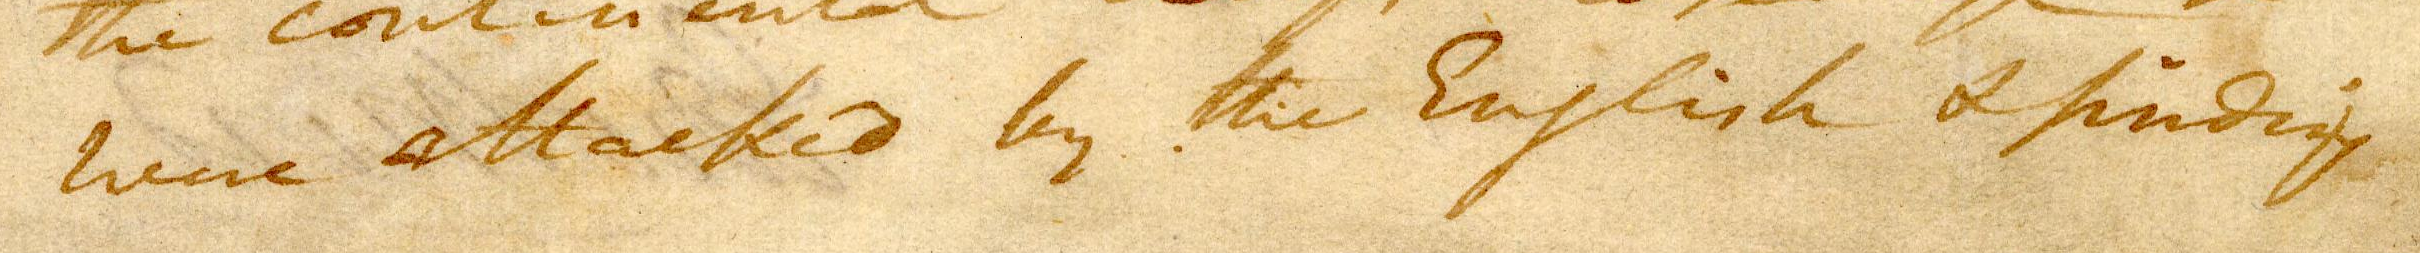were attacked by the English & finding
